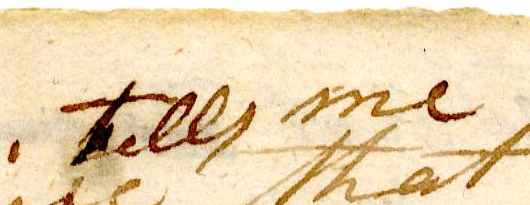tells me
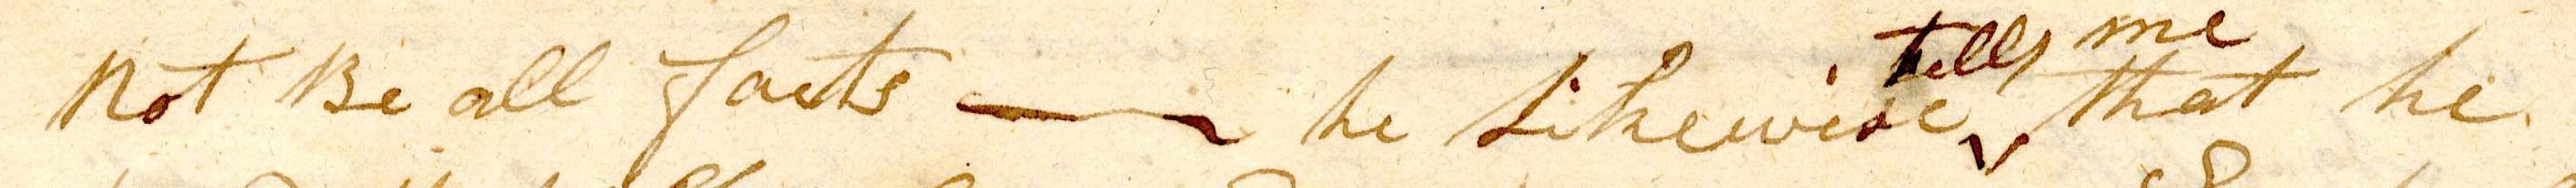Not Be all facts- he Likewise ^ that he
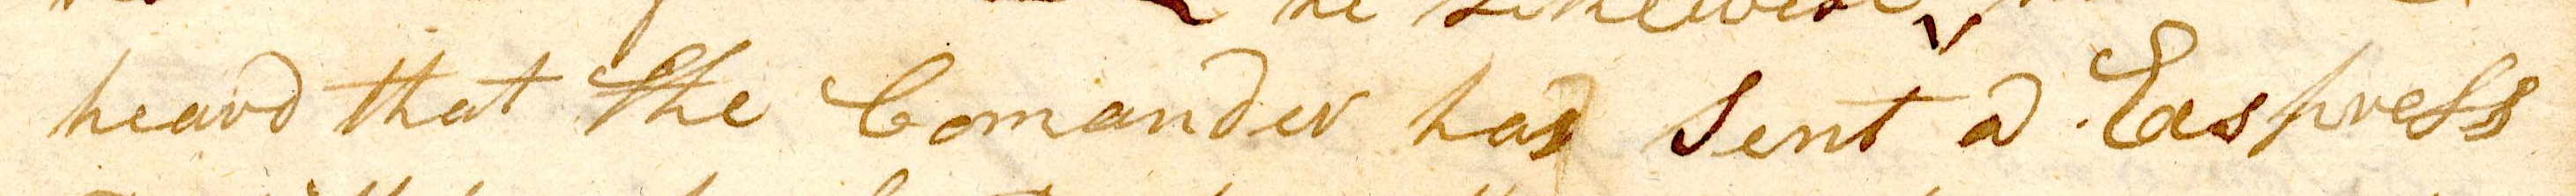heard that the Comander had Sent a Exspress
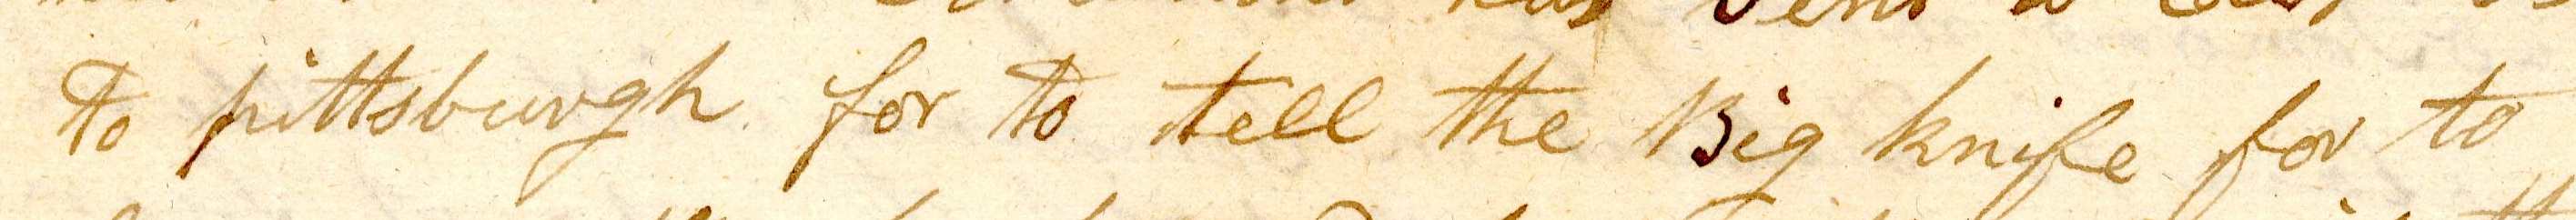to pittsburgh for to tell the Big knife for to
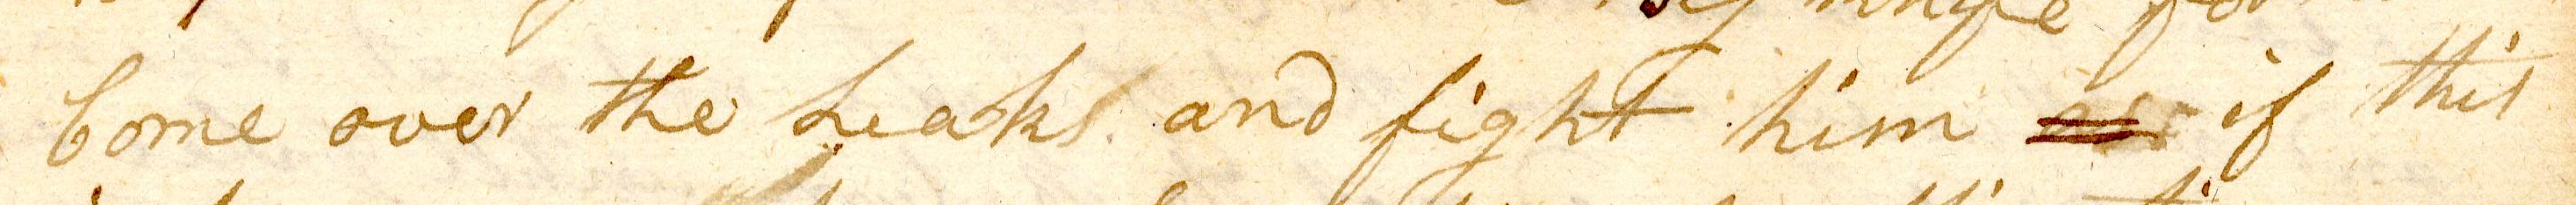Come over the Leaks and fight him as if this
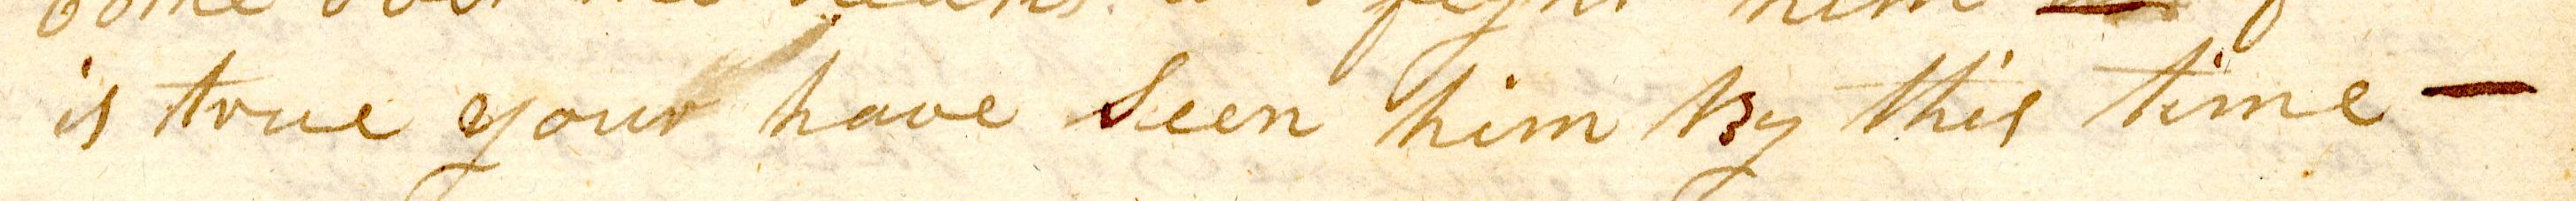is true your have Seen him By this time-
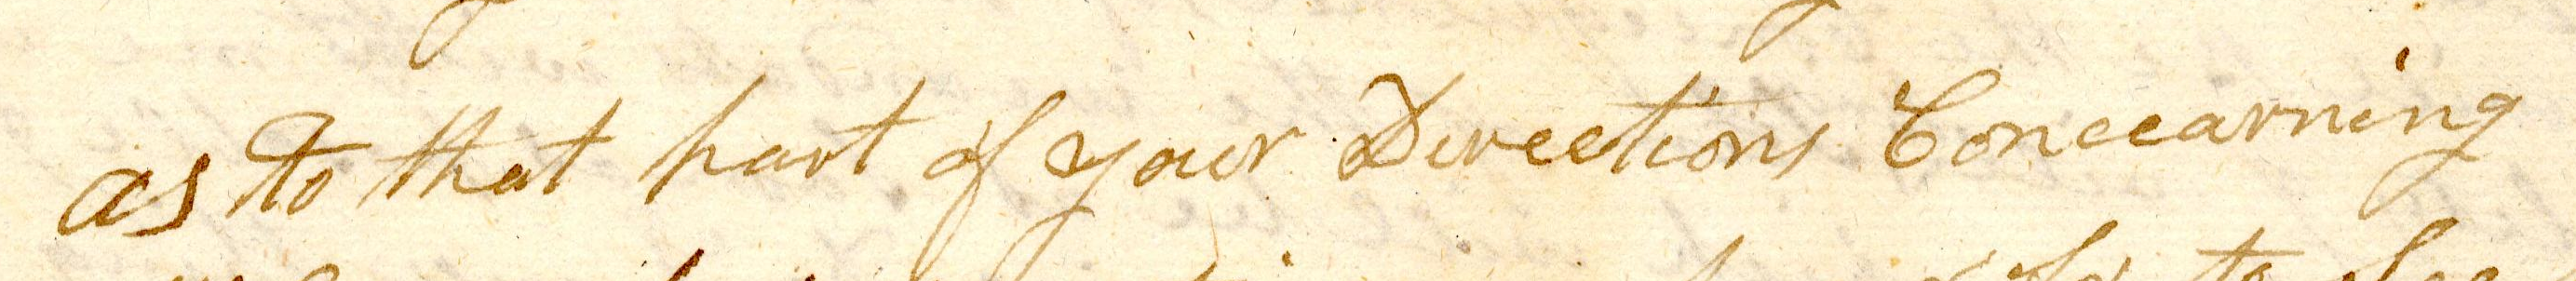as to that part of your Directions Concearning
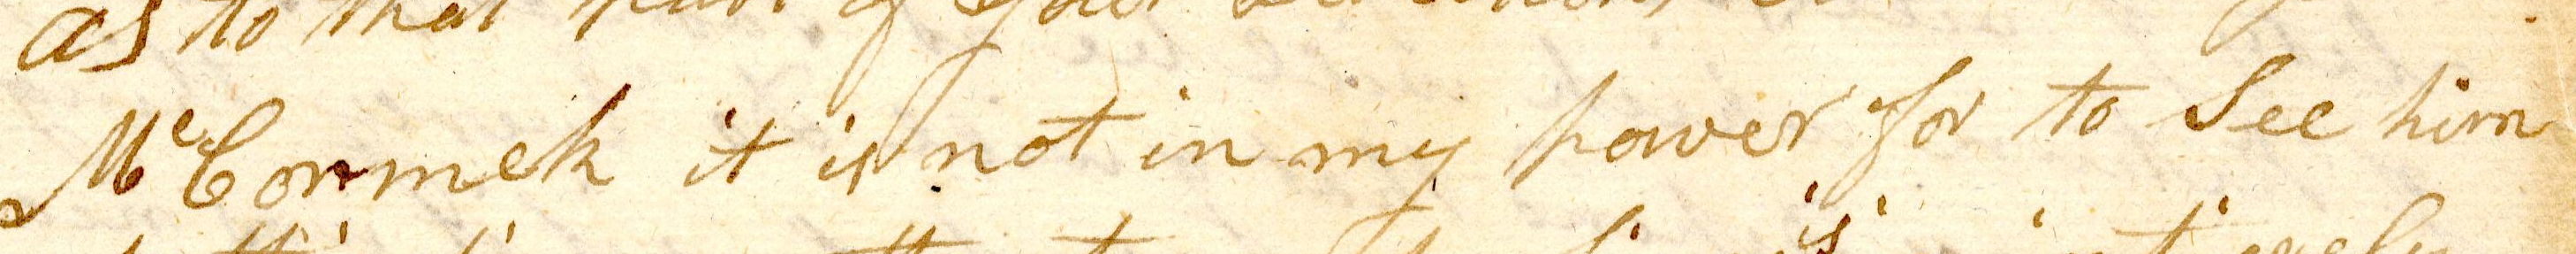M^cCormek it is not in my power for to See him
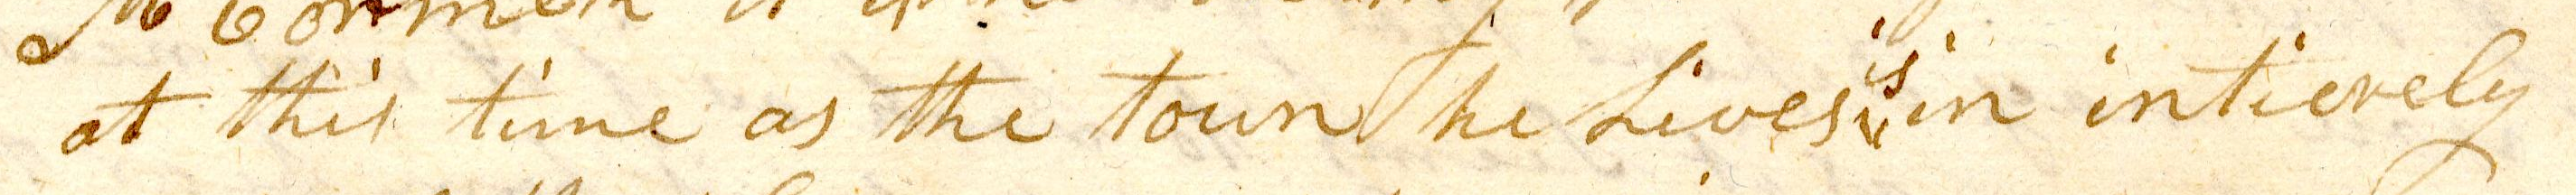at this time as the toun he Lives ^is in intierely
